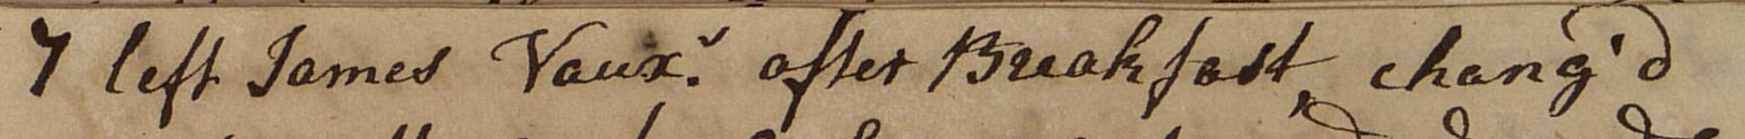7 left James Vaux^s. after Breakfast, chang'd
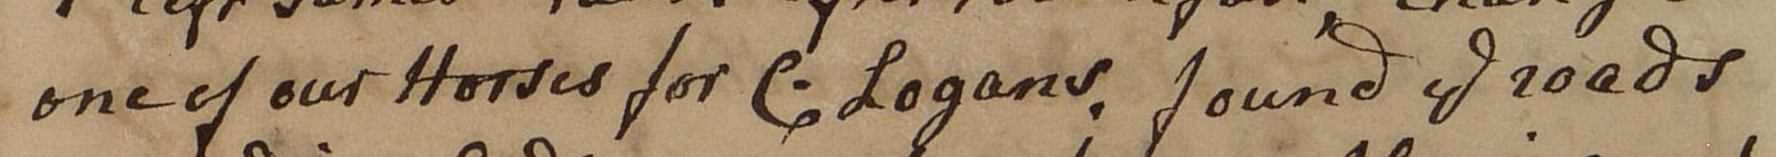one if our Horses for C. Logans. found y^e roads
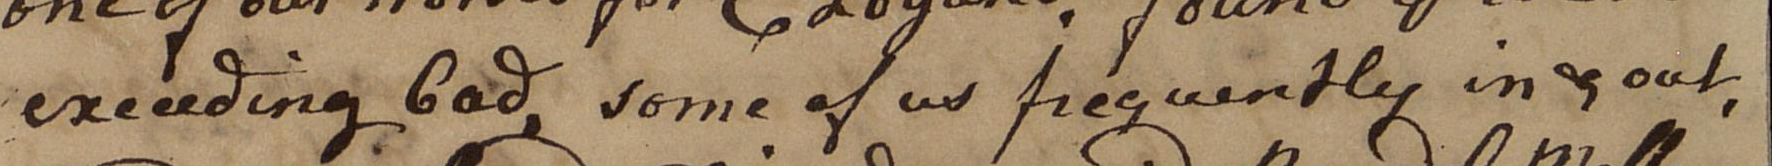exceeding bad, some of us frequently in & out,
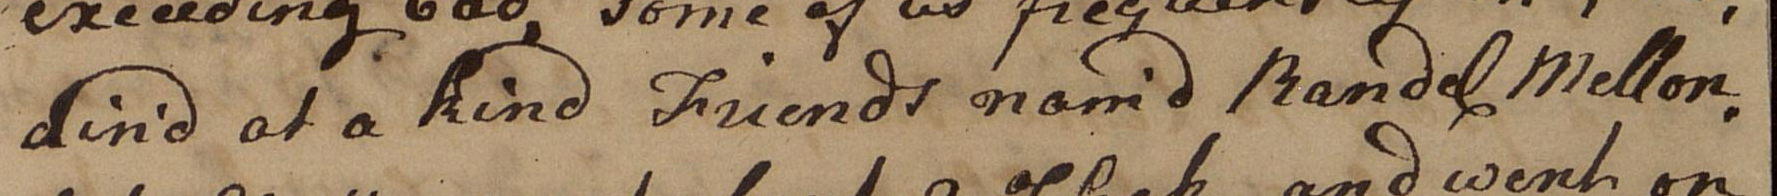din'd at a kind Friends nam'd Randel Mellon,
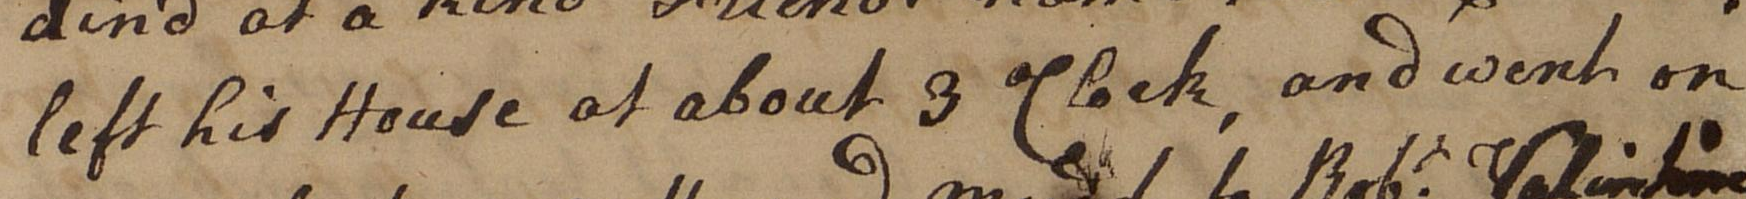left his House at about 3 ^o Clock, and went on
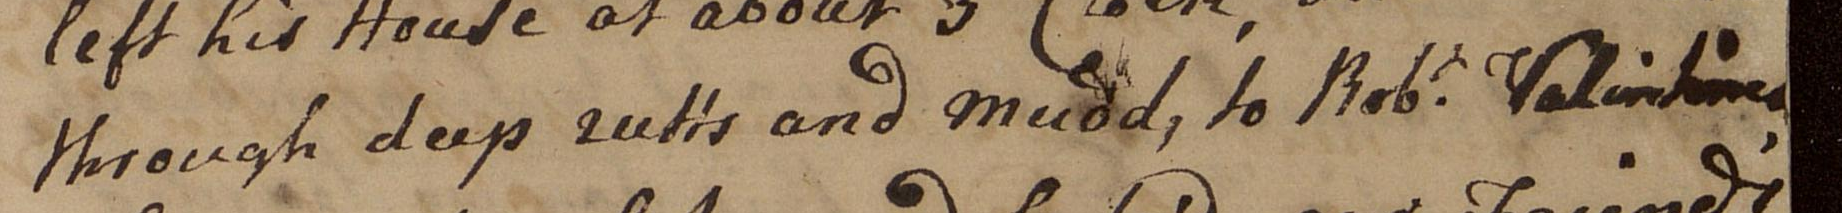through deep rutts and mudd, to Rob^t. Valintines
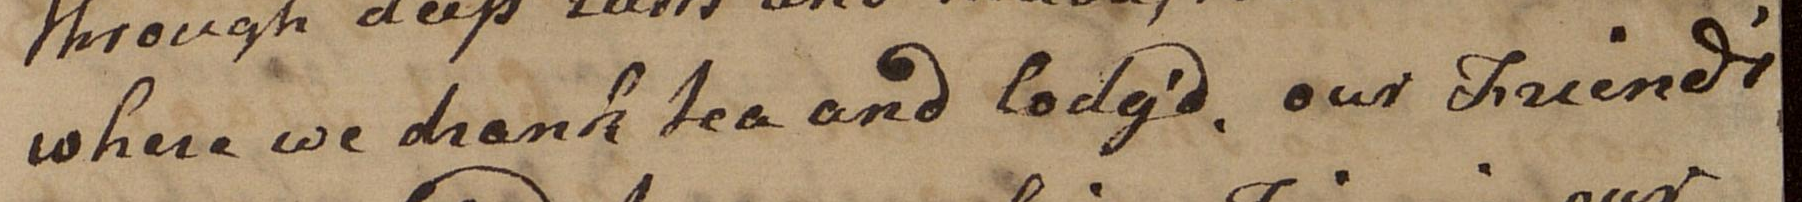where we drank tea and lodg'd, our Friends
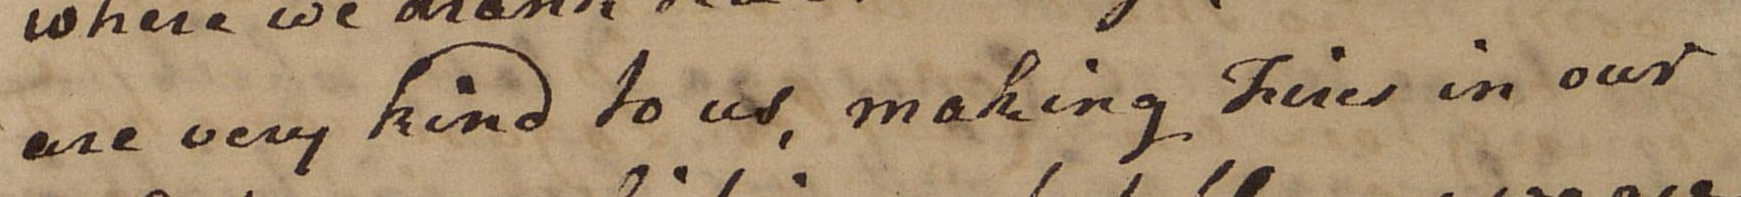are very kind to us, making Fires in our
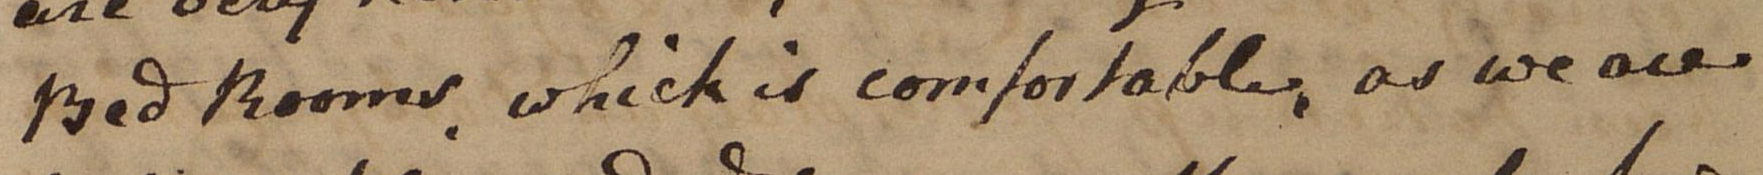Bed Rooms, which is comfortable, as we are
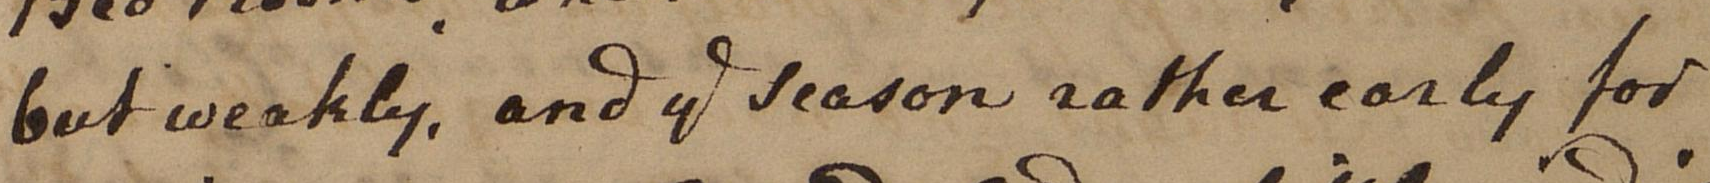but weakly, and y^e season rather early for
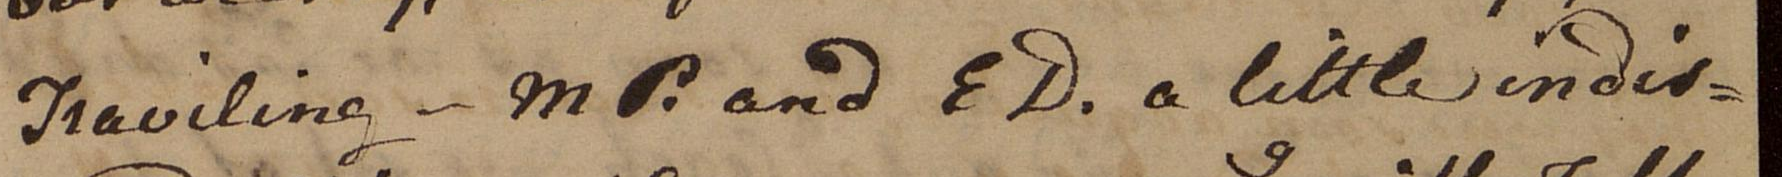Traviling- MP. and ED. a little indis-
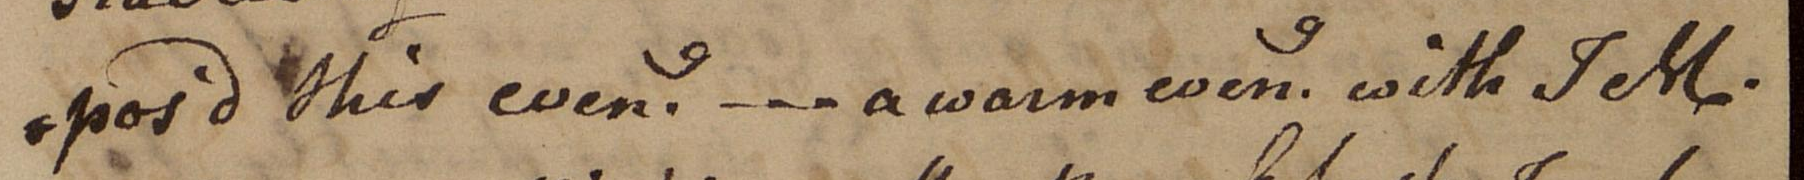-pos'd this even^g.- a warm even^g. with S M.
